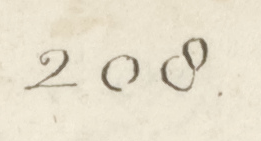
208.
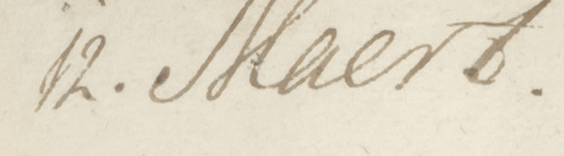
12. Maert.
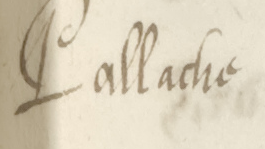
Pallache
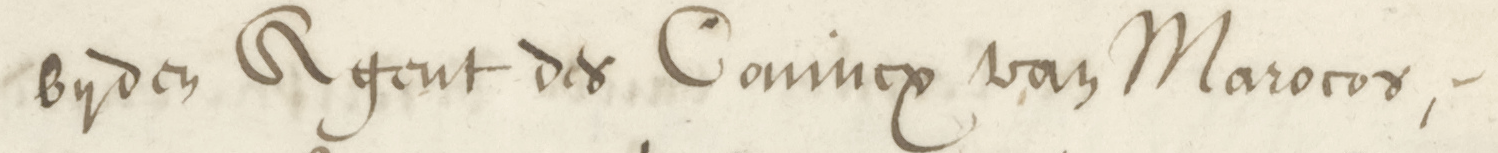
byden Agent des Conincx van Marocos,
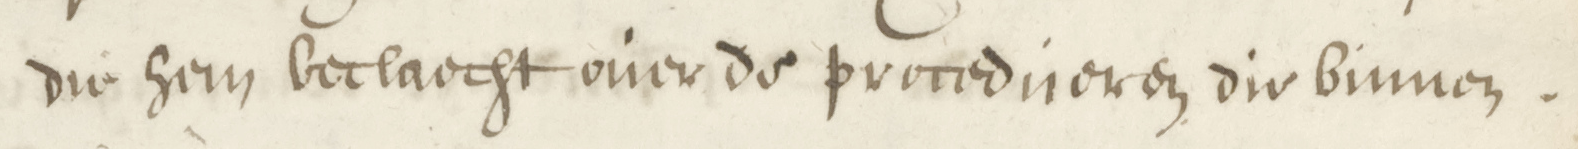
die hem beclaecht ouer de procedueren die binnen
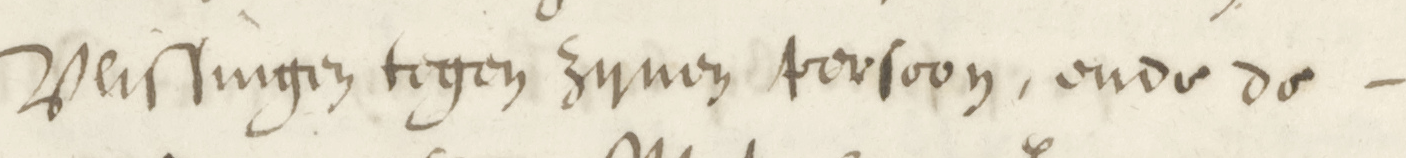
Vlissingen tegen zynen persoon, ende de
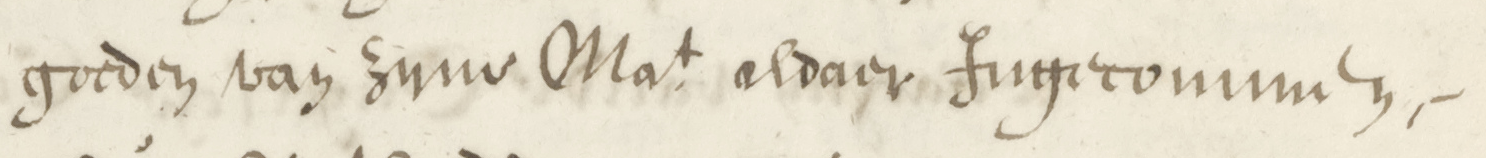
goeden van zyne Mat. aldaer Ingecommen,
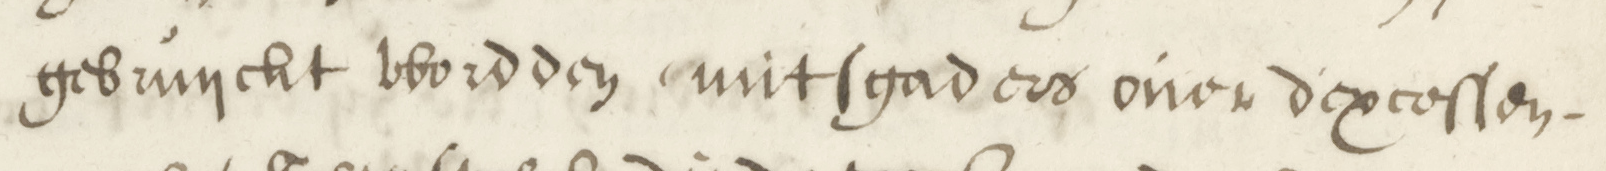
gebruyckt wordden, mitsgaders ouer d'excessen
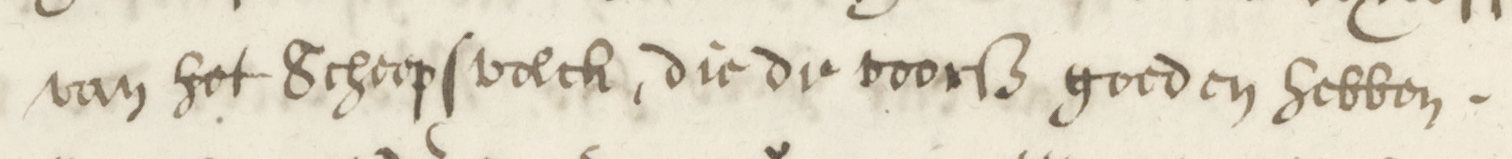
van het Scheepsvolck, die de voors goeden hebben
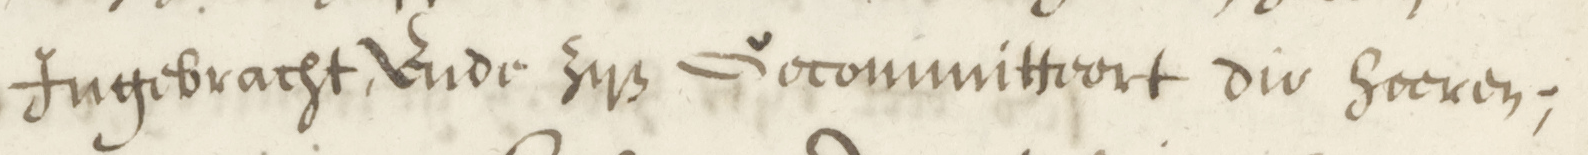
Ingebracht. Ende zyn Gecommitteert die heeren,
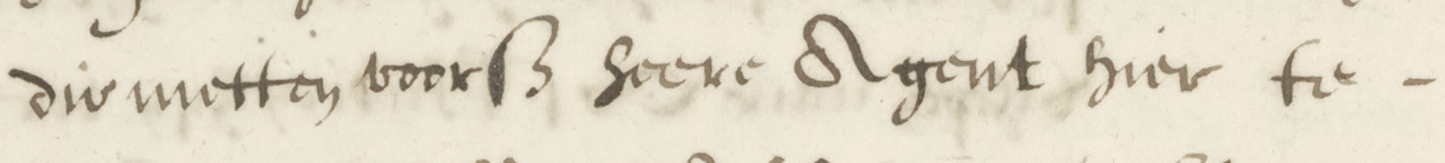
die metten voors heere Agent hier te
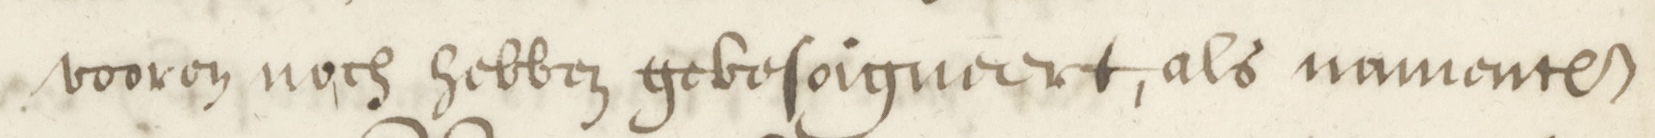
vooren noch hebben gebesoigneert, als namentl
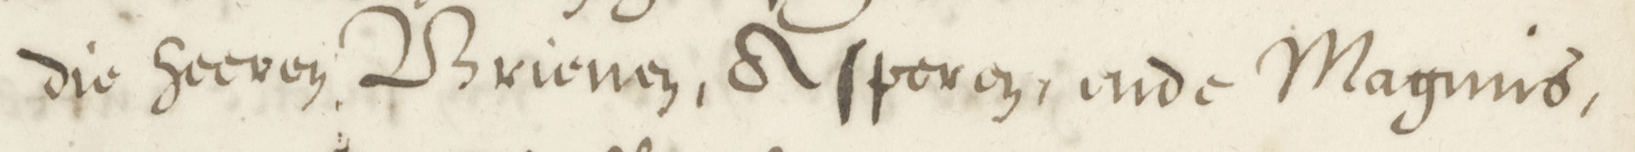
die heeren Brienen, Asperen, ende Magnus,
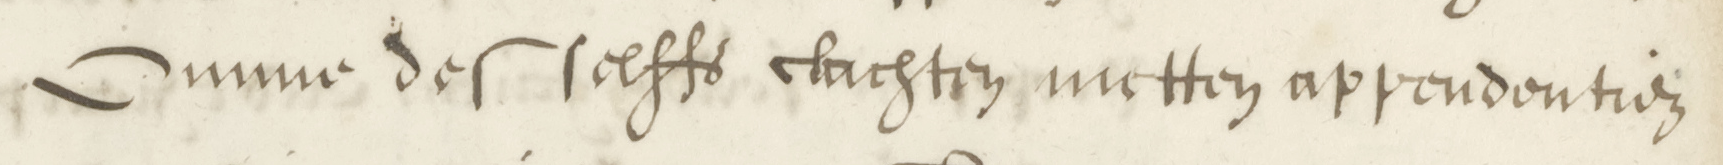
Omme desselffs clachten metten appendentien
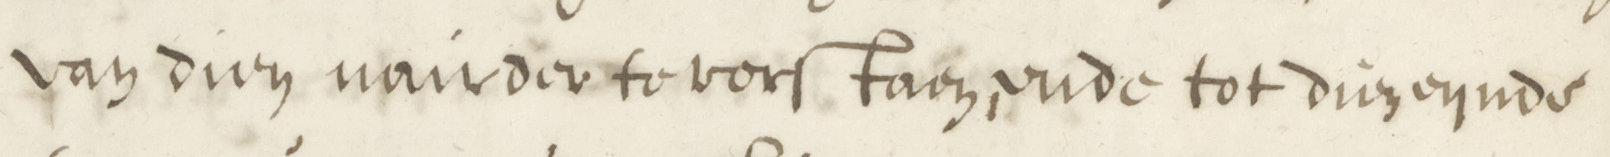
van dien nairder te verstaen, ende tot dien eynde
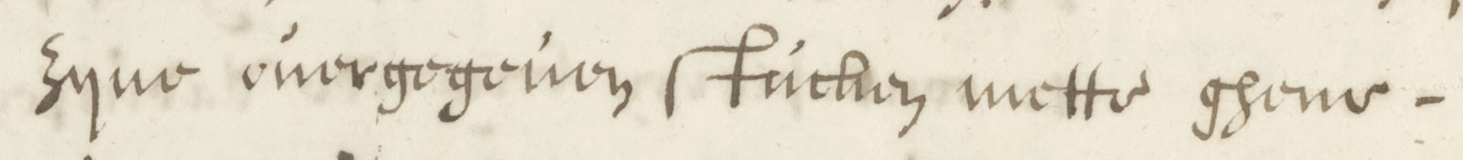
zyne ouergegeuen stucken mette ghene
